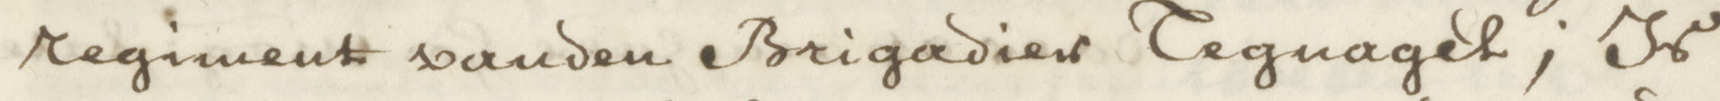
regiment vanden Brigadier Tegnagel, Is
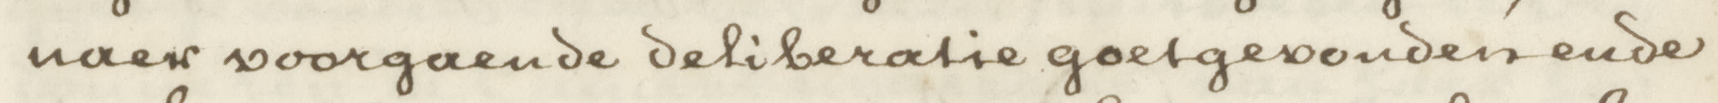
naer voorgaende deliberatie goetgevonden ende
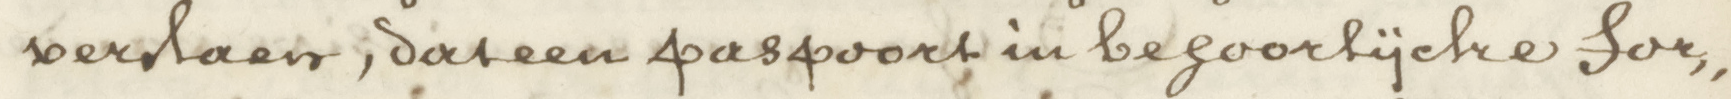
verslaen, dat een paspoort in behoorlijcke for„
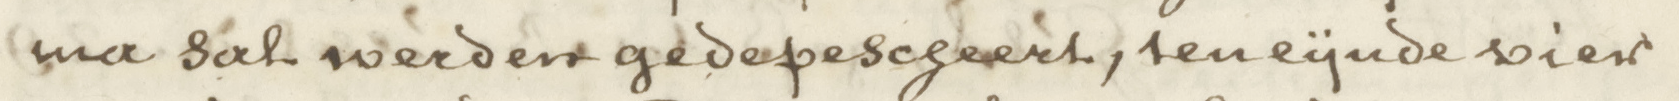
ma sal werden gedepescheert, teneijnde vier
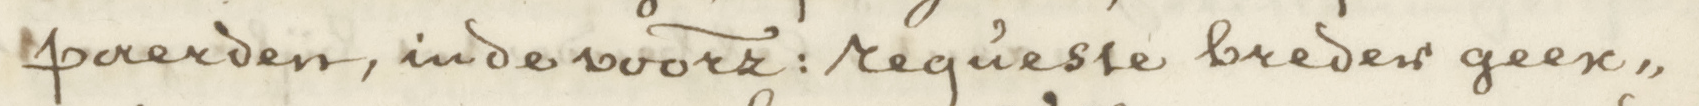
paerden, inde voorz: requeste breder geex„
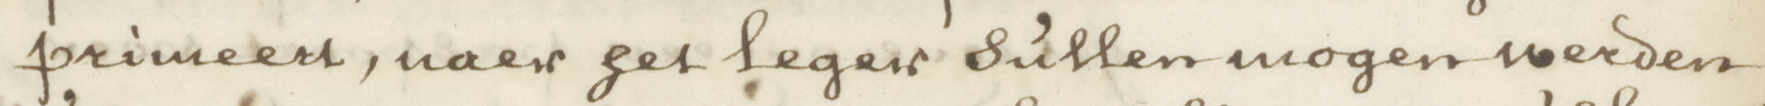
primeert, naer het leger sullen mogen werden
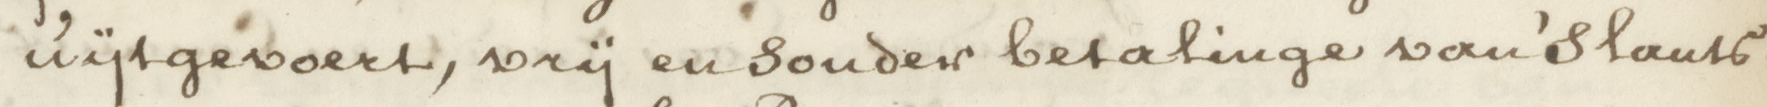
uijtgevoert, vrij en sonder betalinge van ‛slants
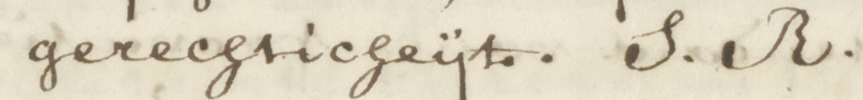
gerechticheijt. S. R.
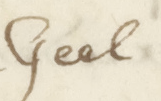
Geel
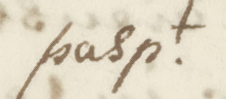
paspt.
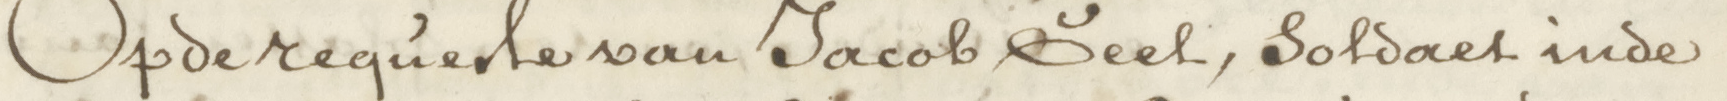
Opde requeste van Jacob Geel, soldaet inde
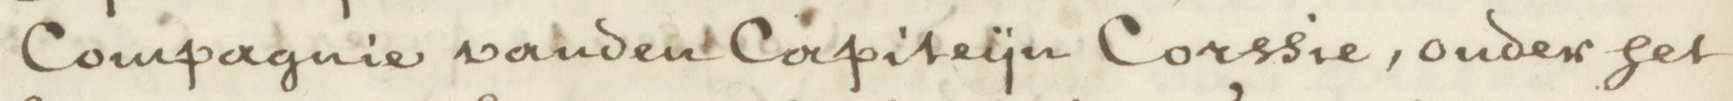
Compagnie vanden Capiteijn Corssie, onder het
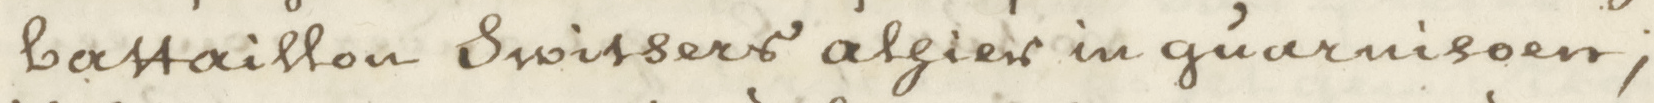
battaillon Switsers alhier in guarnisoen;
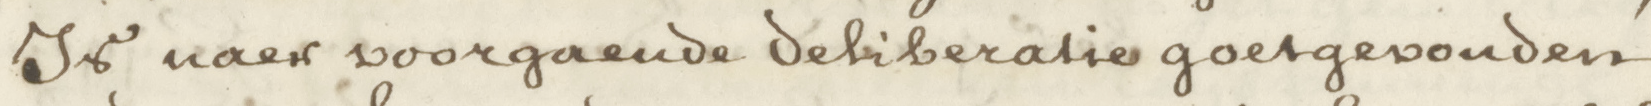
Is naer voorgaende deliberatie goetgevonden
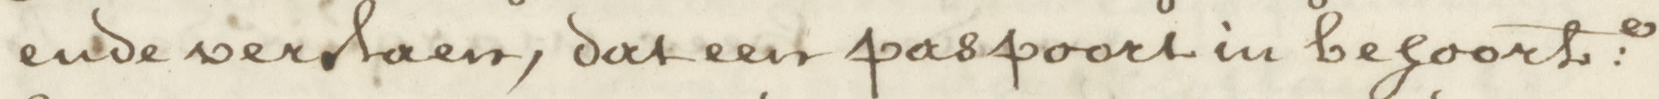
ende verstaen, dat een paspoort in behoorle:
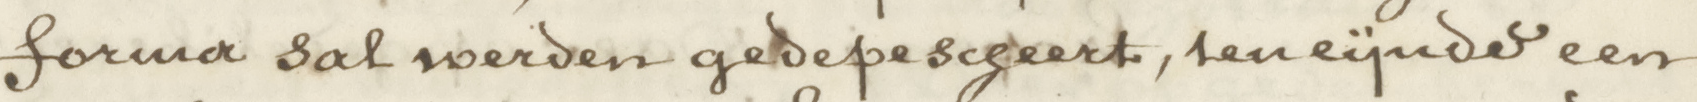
forma sal werden gedepescheert, ten eijnde een
